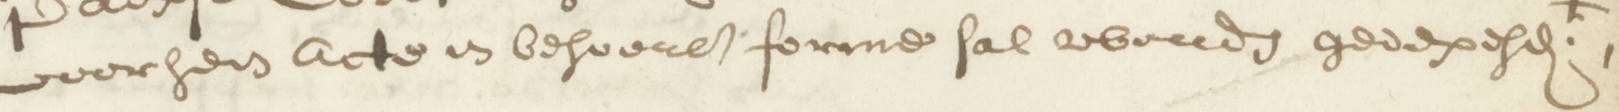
voor hem acte in behoorl forme sal worden gedepescht.
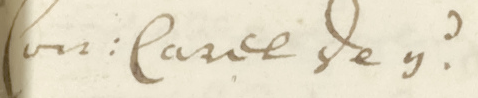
Con: Carel de ije.
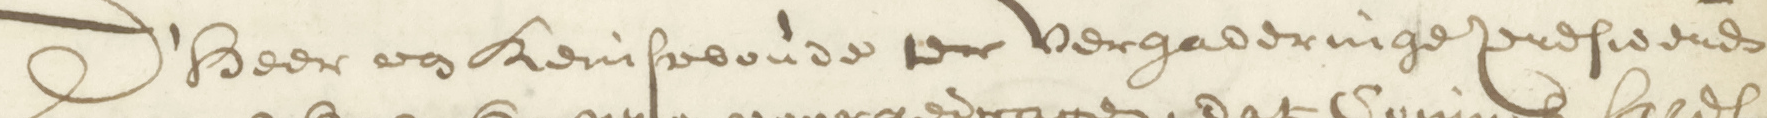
D'heer van Reinswoude ter Vergaderinge presideren
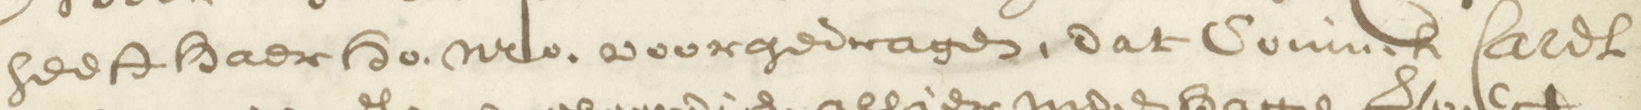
heeft haer Ho:Mo: voorgedragen, dat Coninck Carel
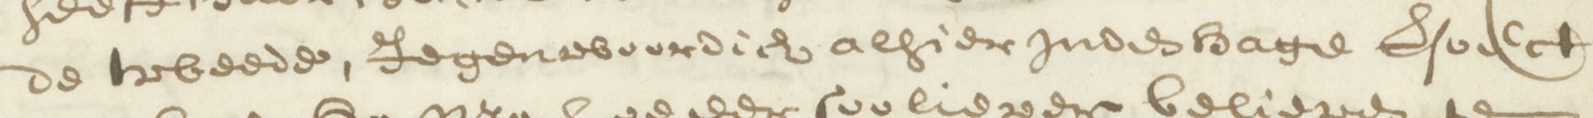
de tweede, Jegenwoordich alhier Inden Hage vsoect,
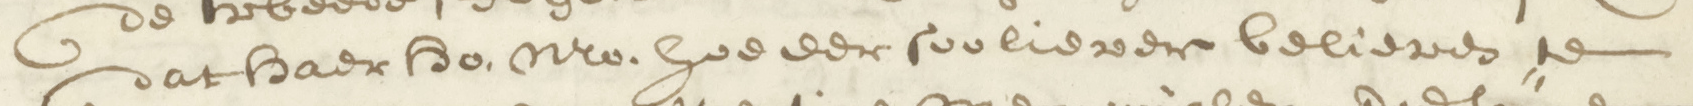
dat haer Ho:Mo: Hoe eer soo liever believen te
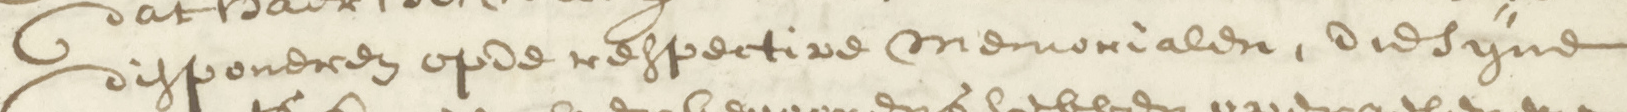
disponeren opde respective memorialen, die sijne
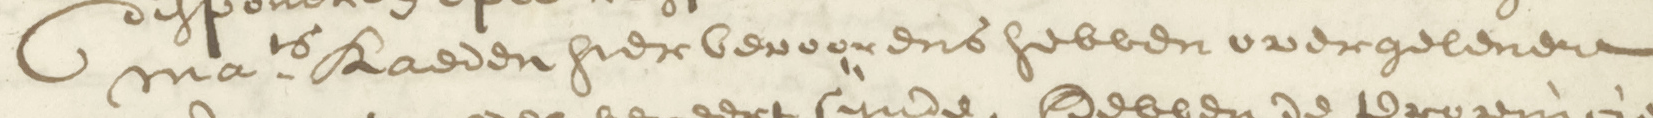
Mats. Raeden hier bevoorens hebben overgelevert
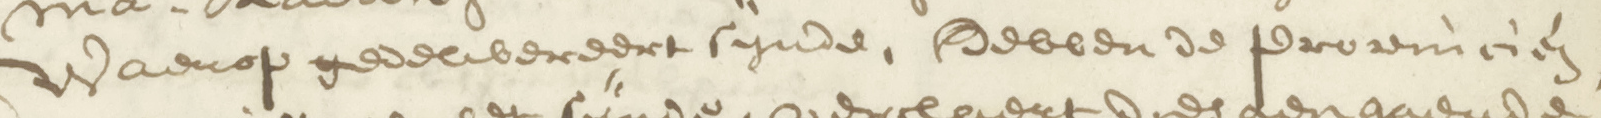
Waerop gedelibereert sijnde, hebben de provincien
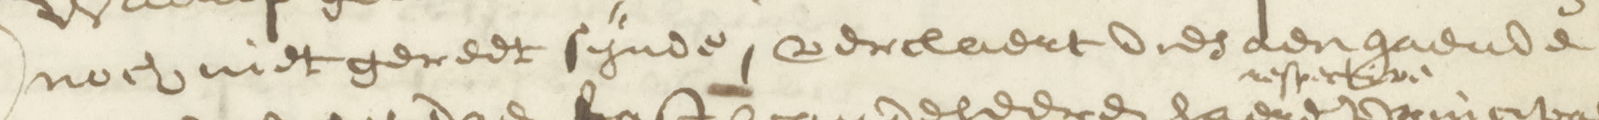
noch niet gereet sijnde, verclaert dien aengaende
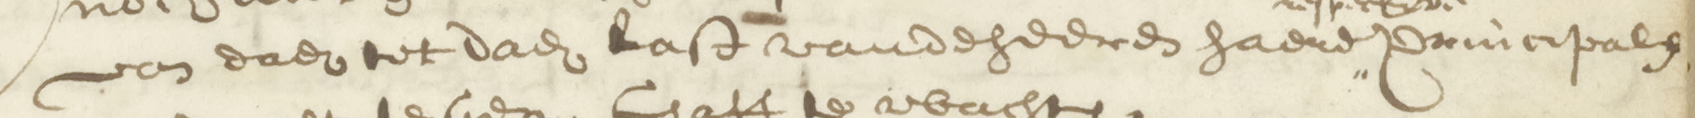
van daer tot daer last vande heeren haere#respective Principalen
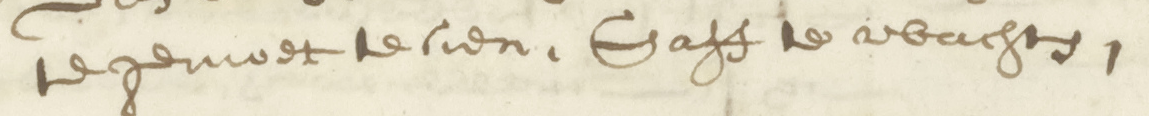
te gemoet te sien, & aff te wachten,
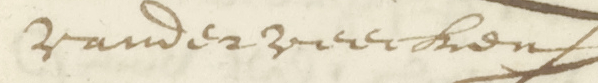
vander veecken
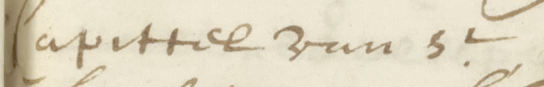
Capittel van St.
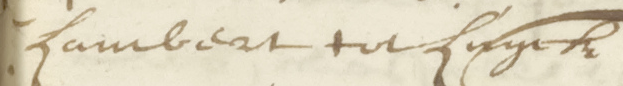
Lambert tot Luyck
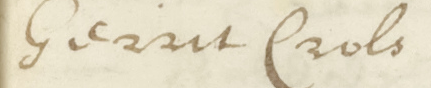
Gerrit Crols
